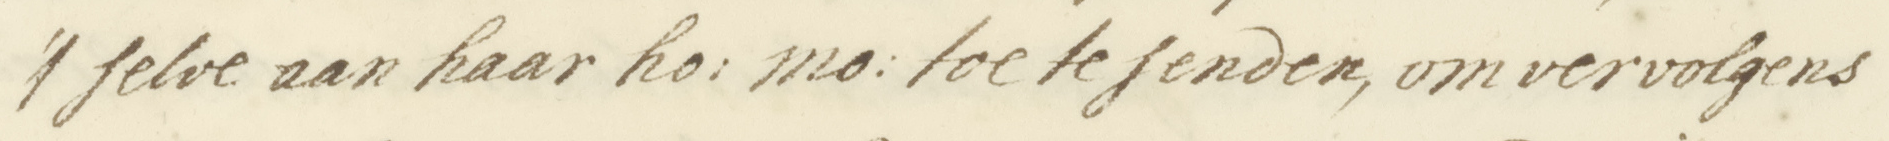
't selve aan haar ho:mo: toe te senden, om vervolgens
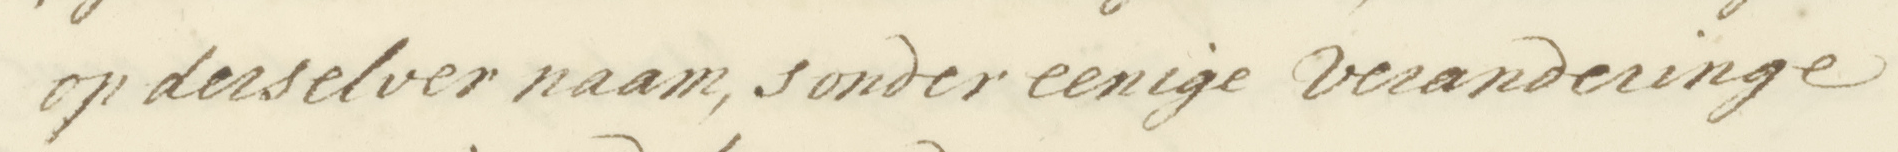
op derselver naam, sonder eenige veranderinge
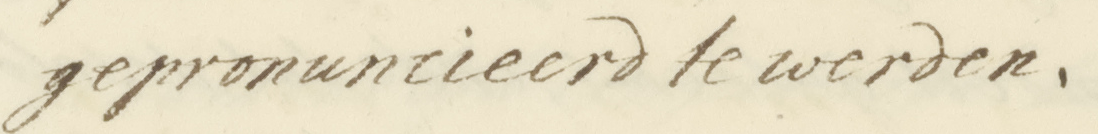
gepronuncieerd te werden.
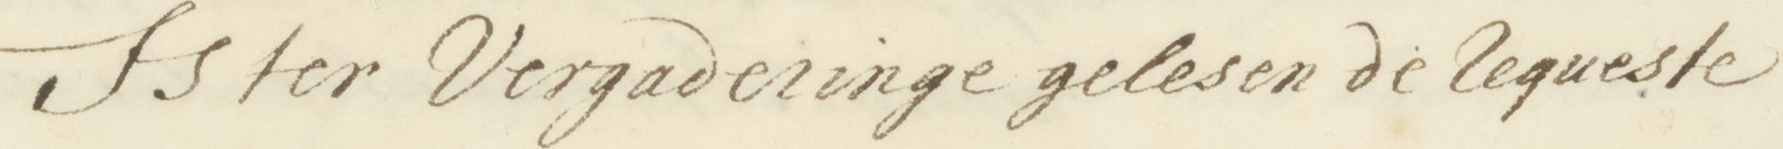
Is ter Vergaderinge gelesen de requeste
